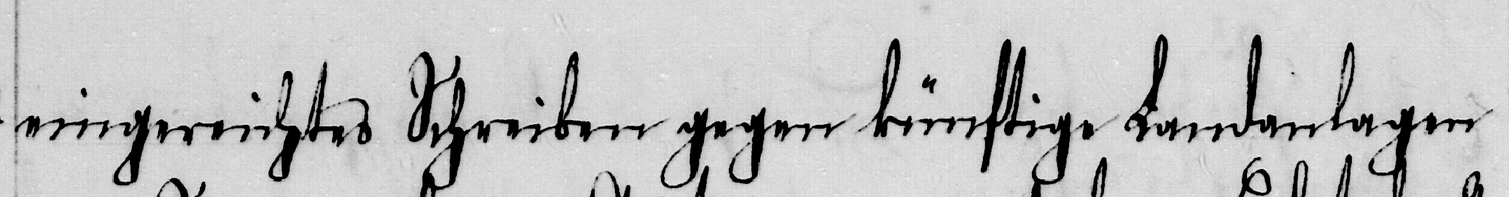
eingereichtes Schreiben gegen künftige Landanlagen
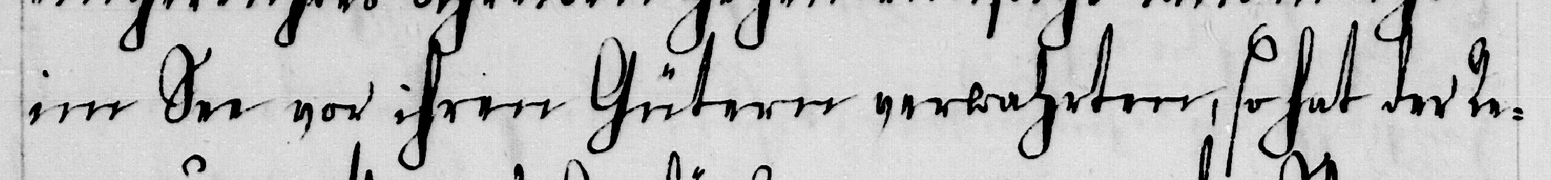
im See vor ihren Gütern verwahrten, so hat der Re¬
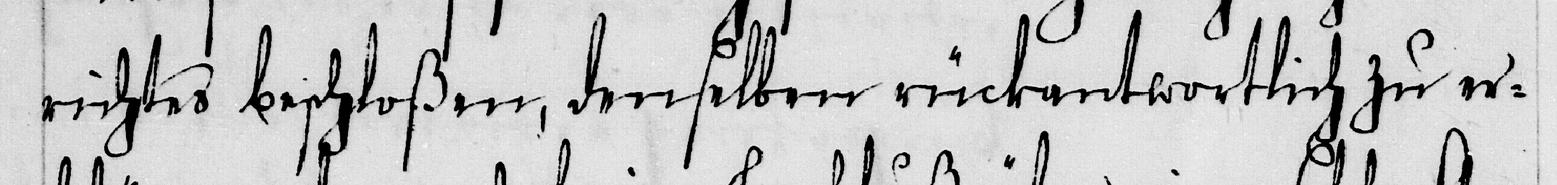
richtes beschloßen, denselben rückantwortlich zu er¬
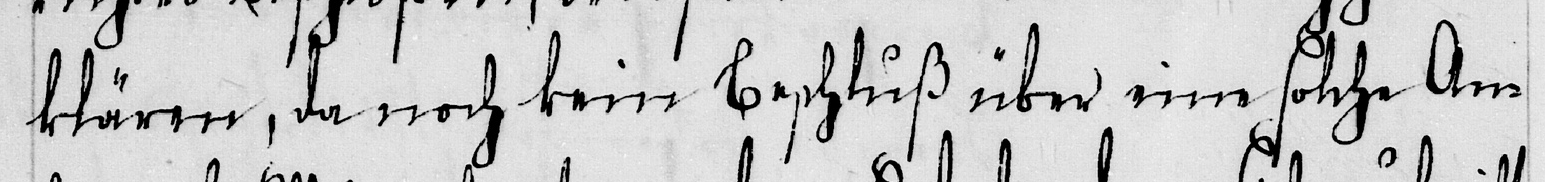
klären, da noch kein Beschluß über eine solche An¬
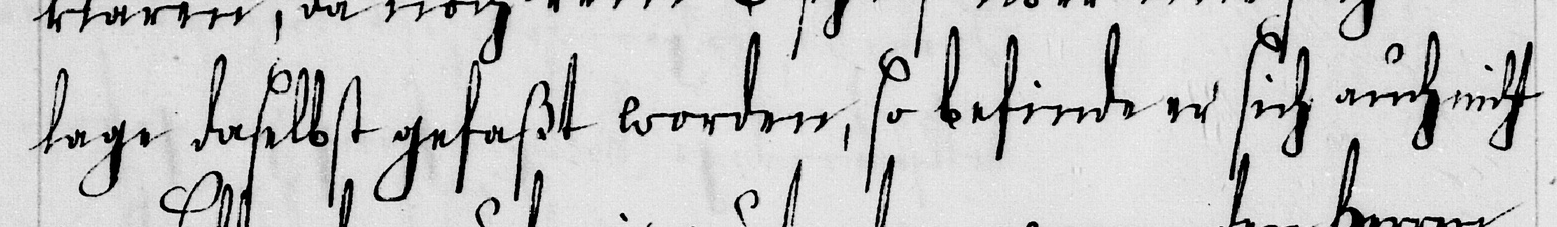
lage daselbst gefaßt worden, so befinde er sich auch
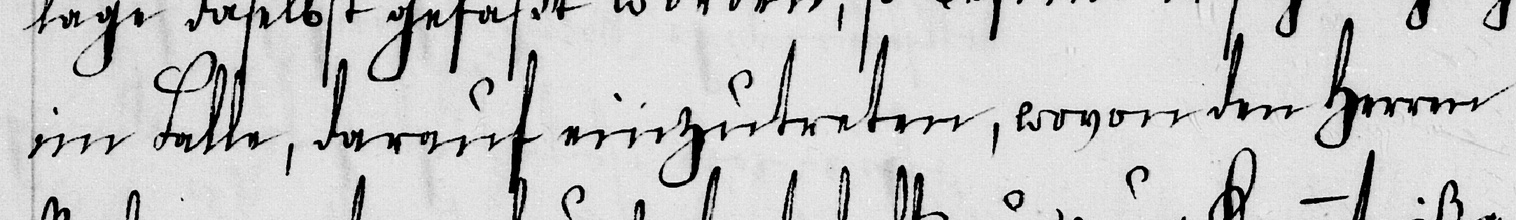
im Falle, darauf einzutreten, wovon den Herren
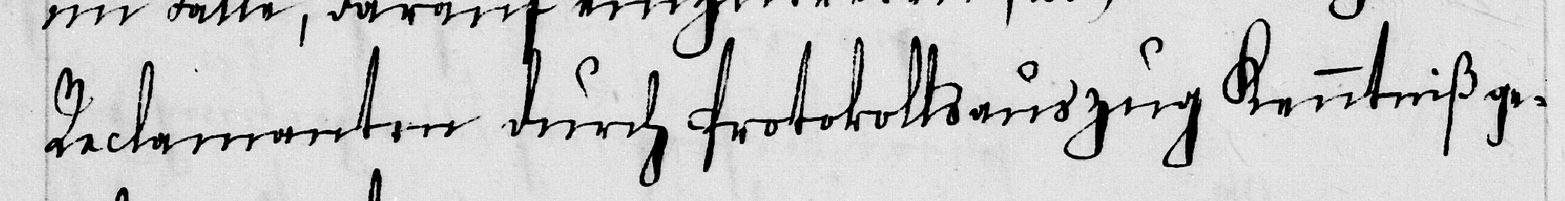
Reclamanten durch Protokollsauszug Kenntniß ge¬
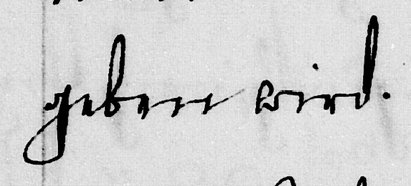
geben wird.
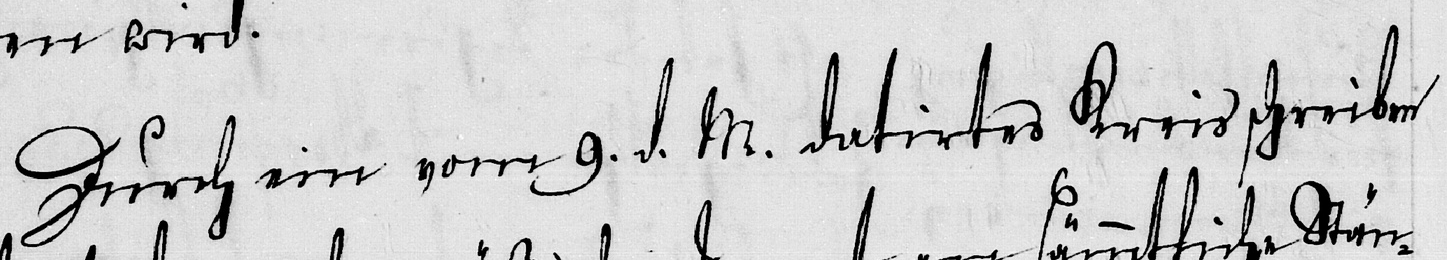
Durch ein vom 9. d. M. datirtes Kreisschreiben
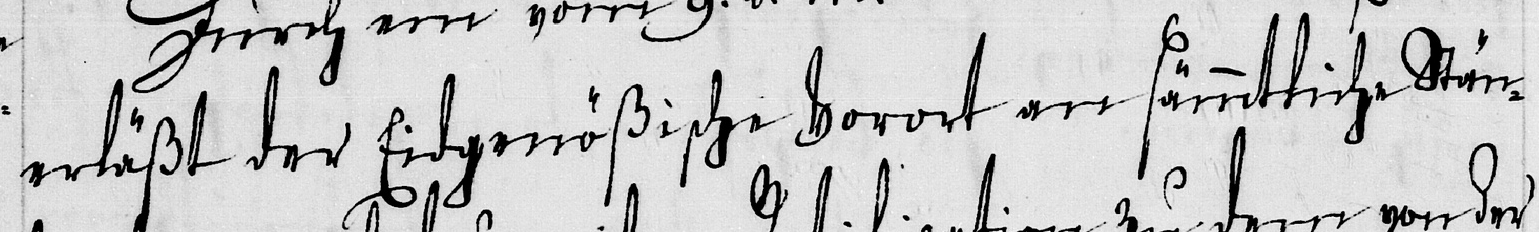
erläßt der Eidgenößische Vorort an sämmtliche Stän¬
